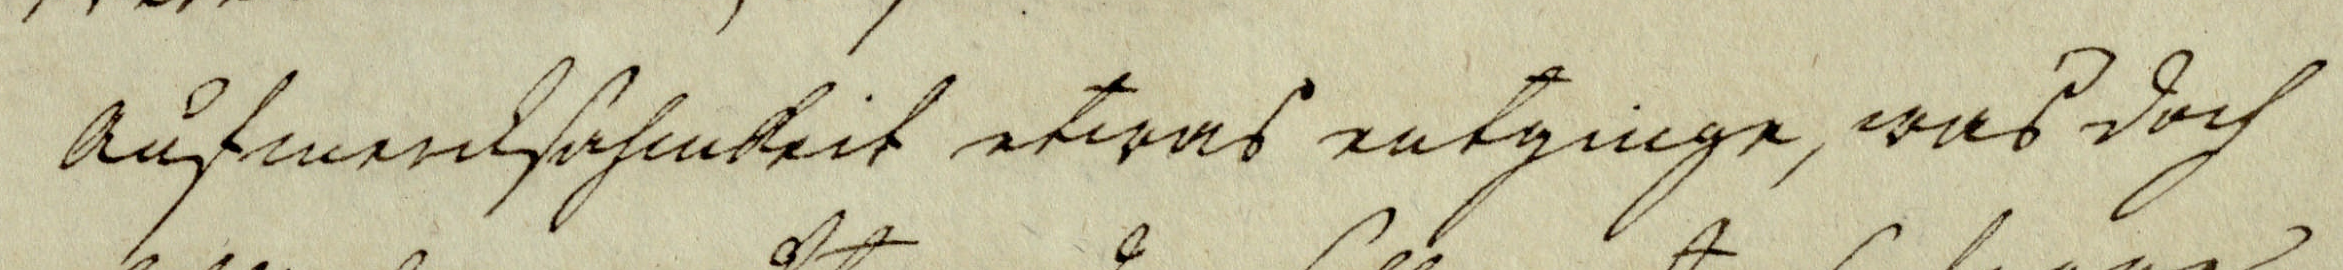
Aufmercksahmkeit etwas entginge, was doch
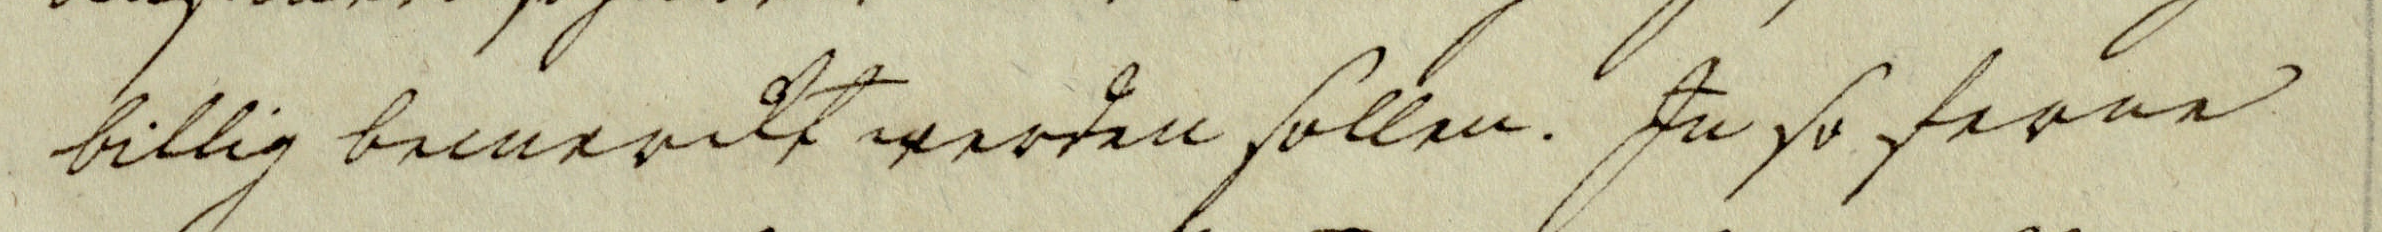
billig bemerckt werden sollen. In so ferne
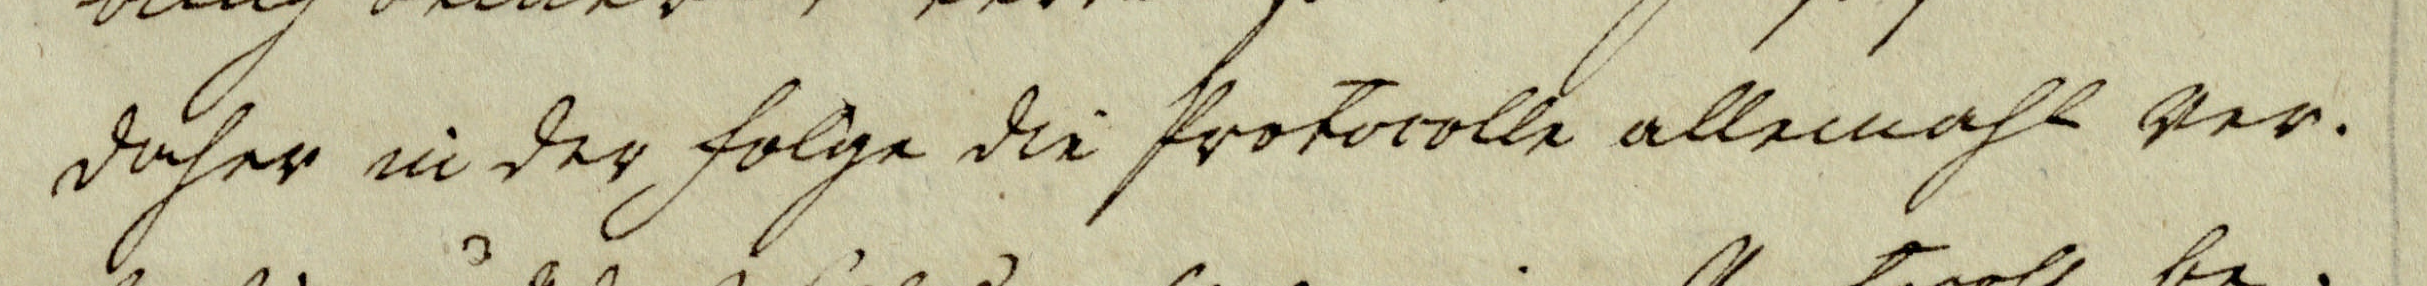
daher in der Folge die Protocolle allemahl ver¬
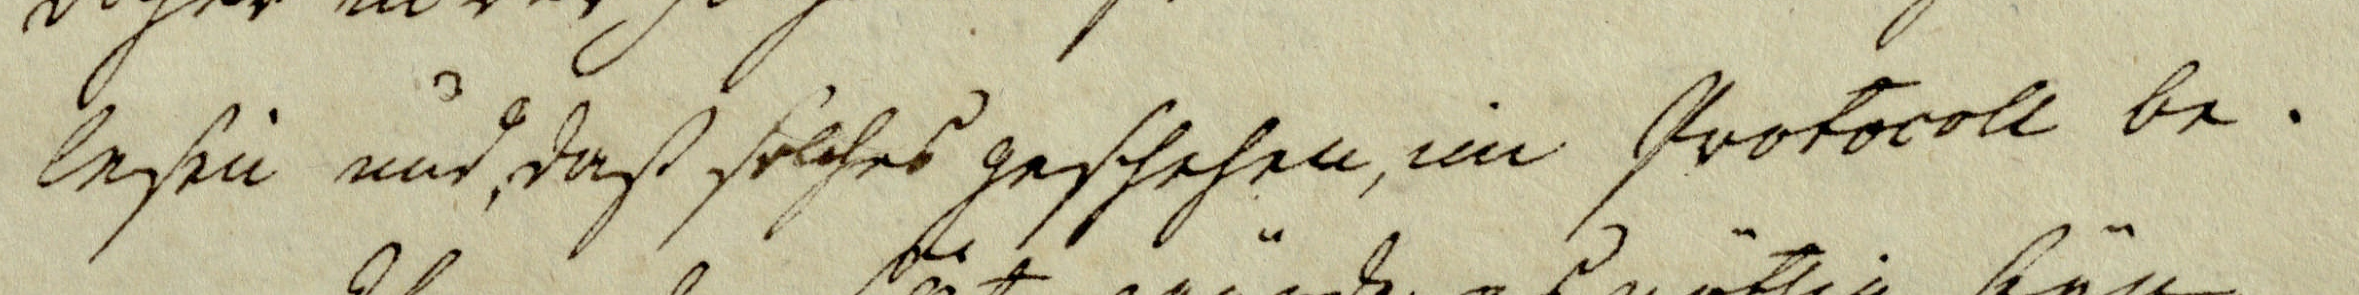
lesen und, daß solches geschehen, im Protocoll be¬
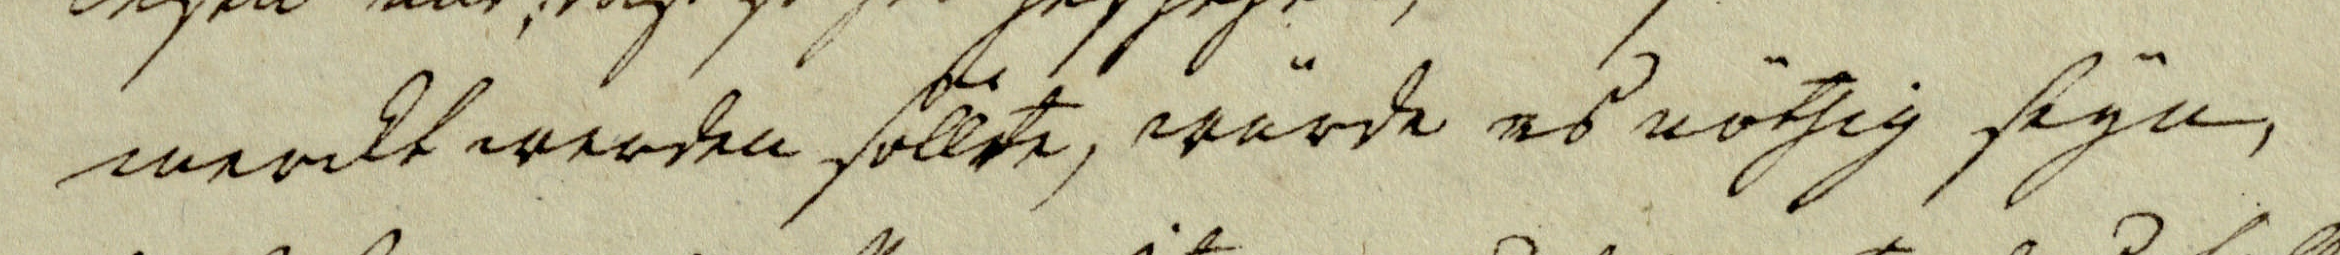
merckt werden sollte, würde es nöthig seÿn,
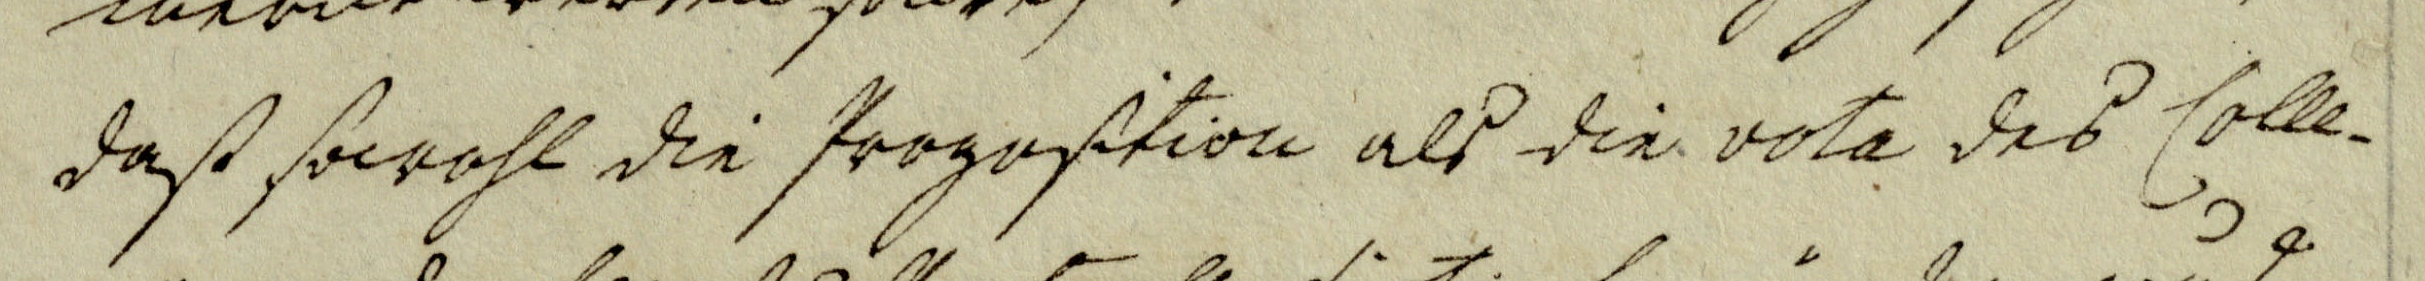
daß sowohl die Proposition als die vota des Colle¬
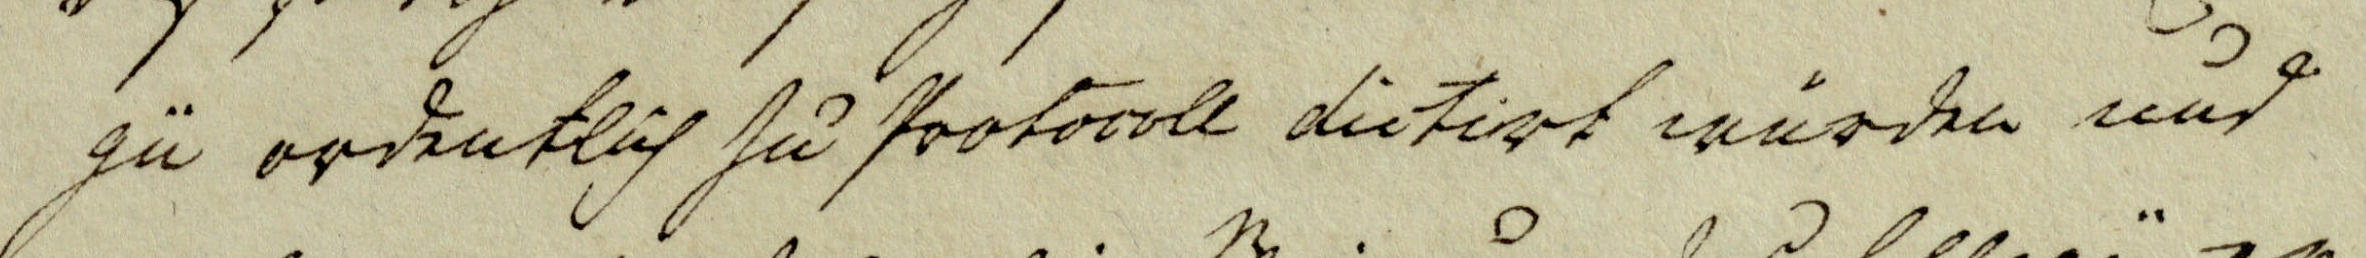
gii ordentlich zu Protocoll dictirt würden und
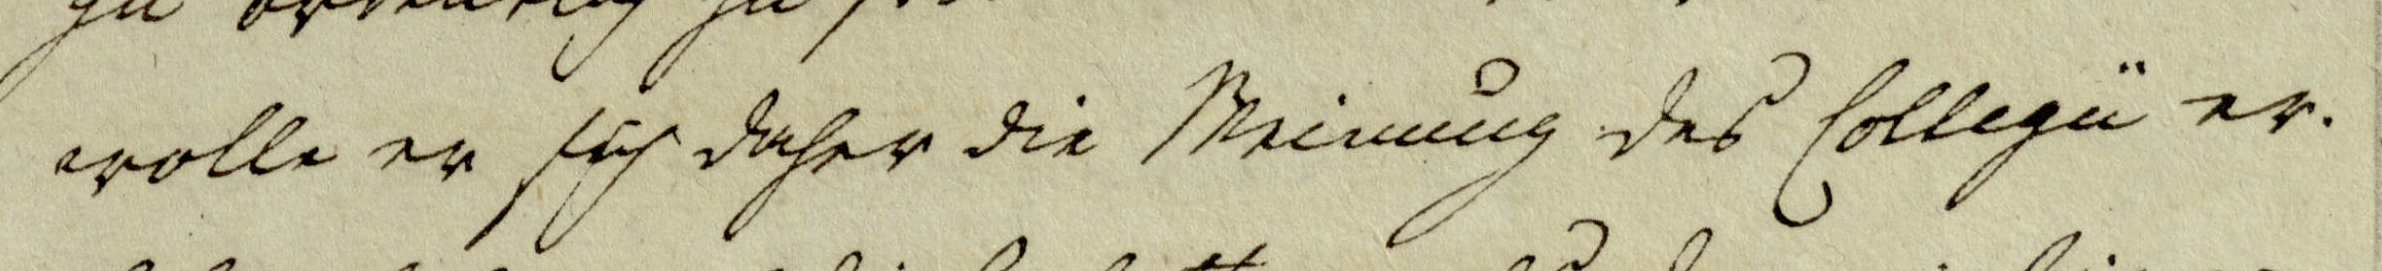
wolle er sich daher die Meinung des Collegii er¬
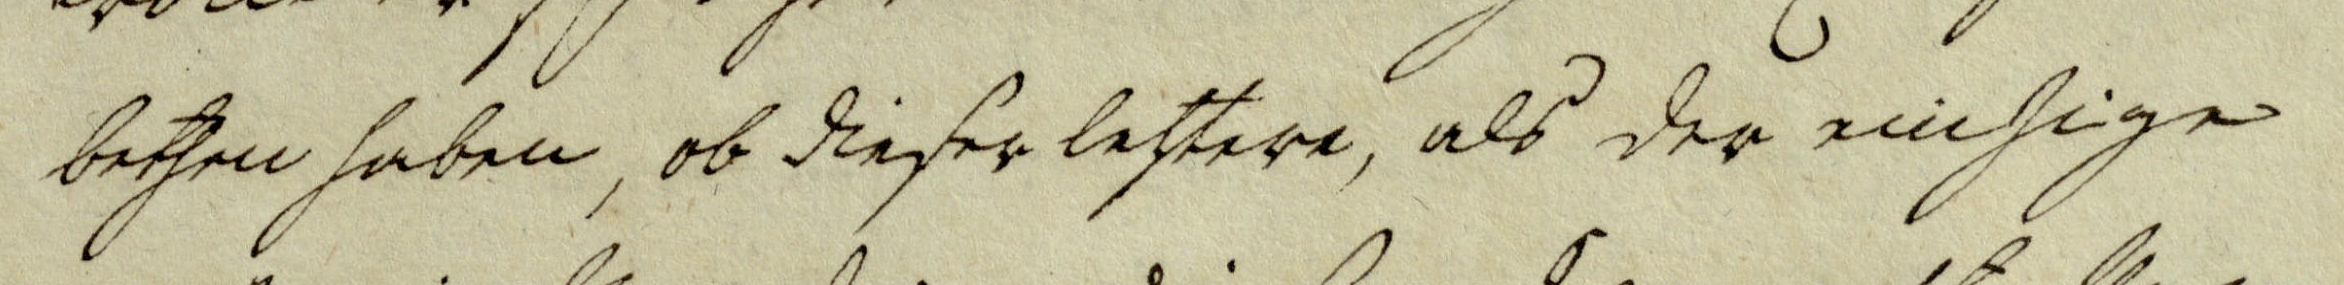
bethen haben, ob dieser letztere, als der einzige
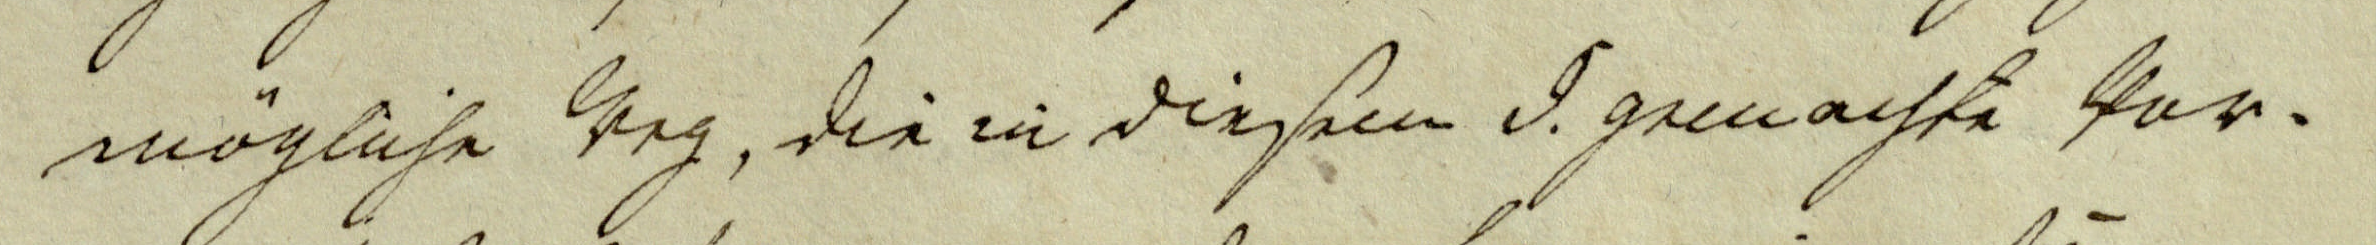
mögliche Weg, die in diesem §. gemachte Vor-
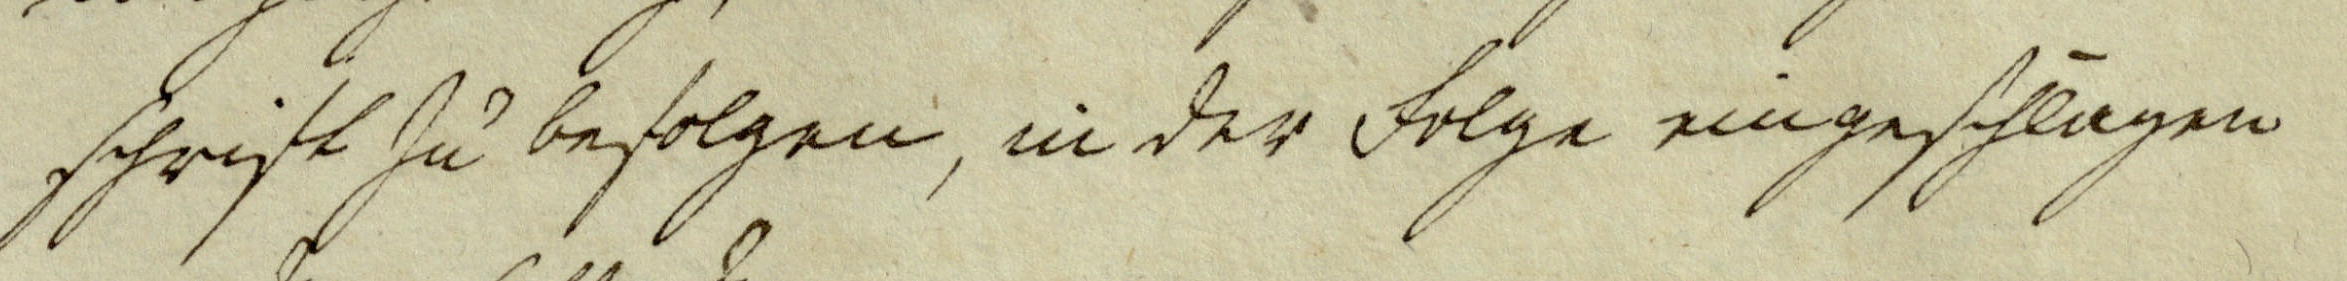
schrift zu befolgen, in der Folge eingeschlagen
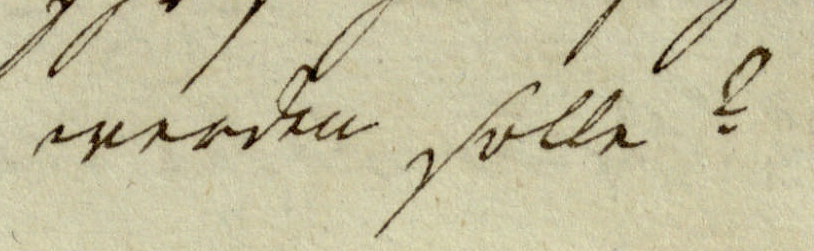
werden solle?
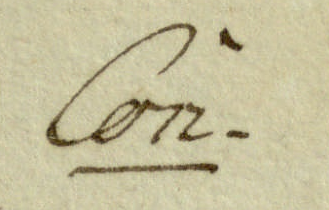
Con.
